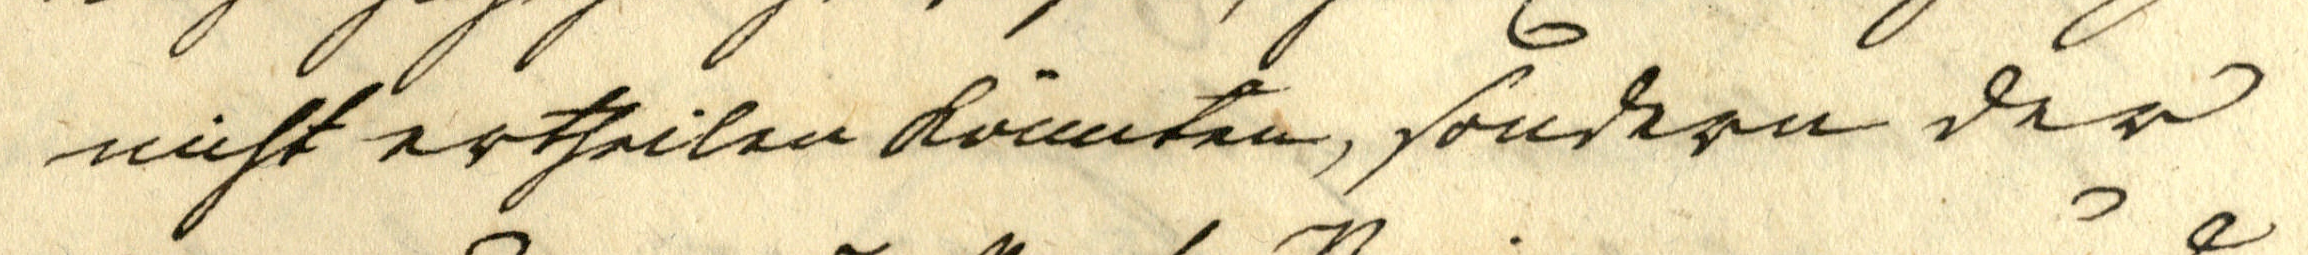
nicht ertheilen könnten, sondern der
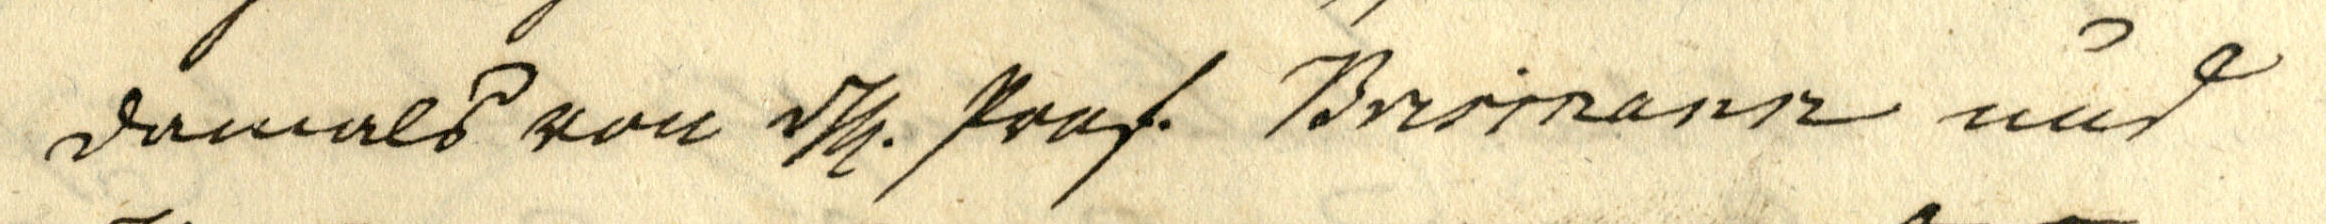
damals von dh. Prof. Brismann und
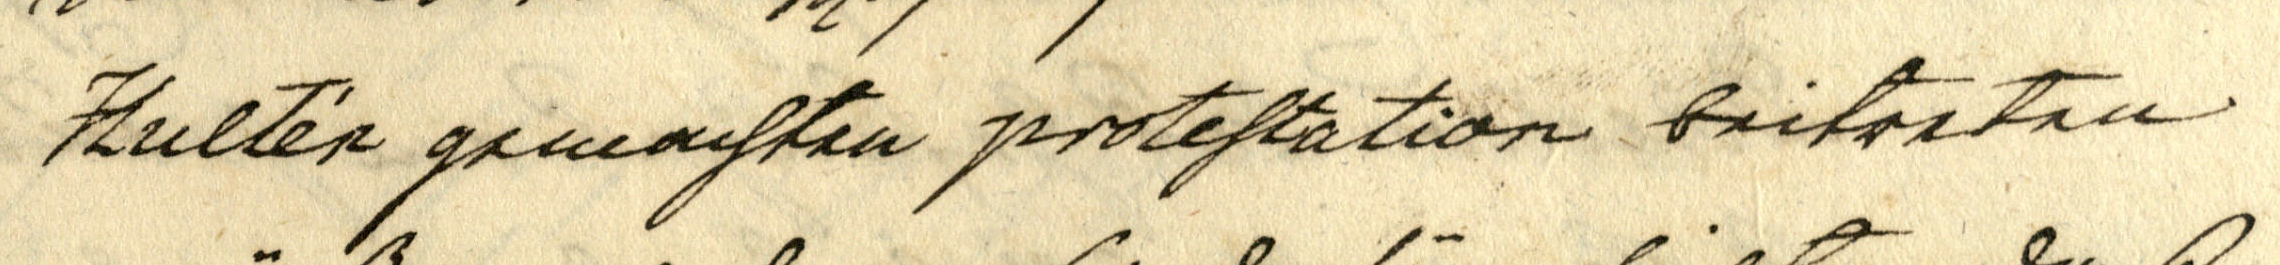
Hultén gemachten protestation beitreten
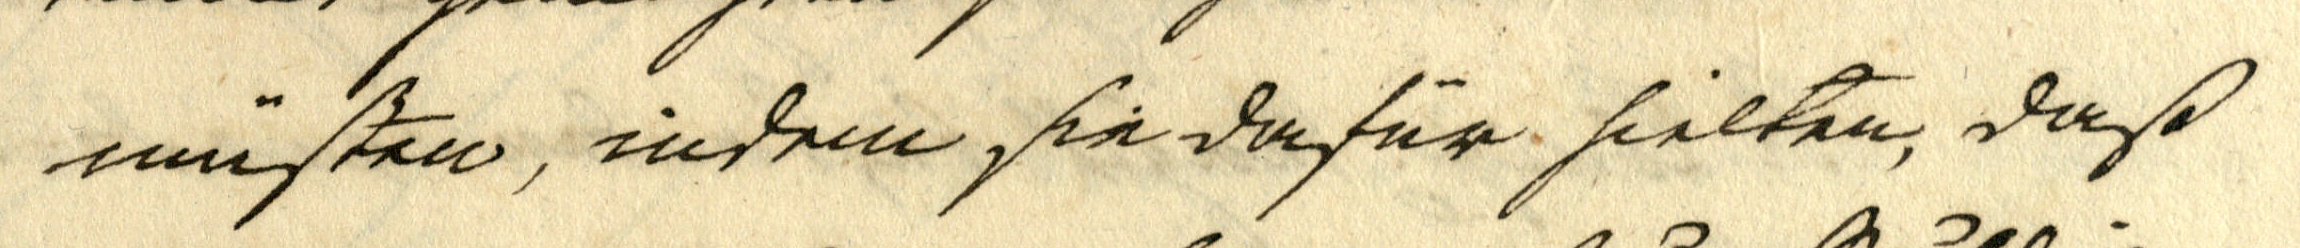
müßten, indem sie dafür hielten, daß
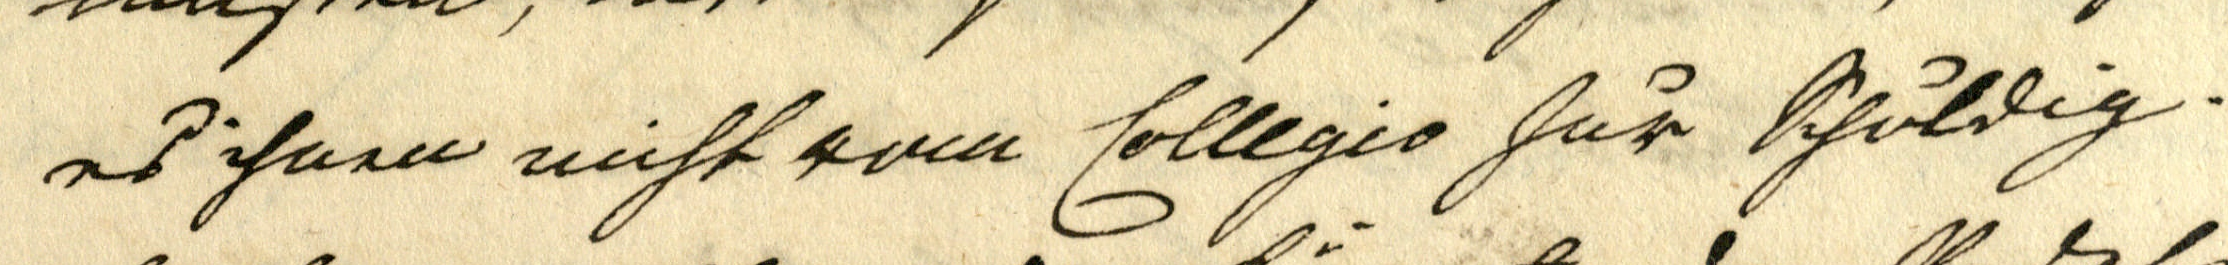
es ihnen nicht vom Collegio zur Schuldig¬
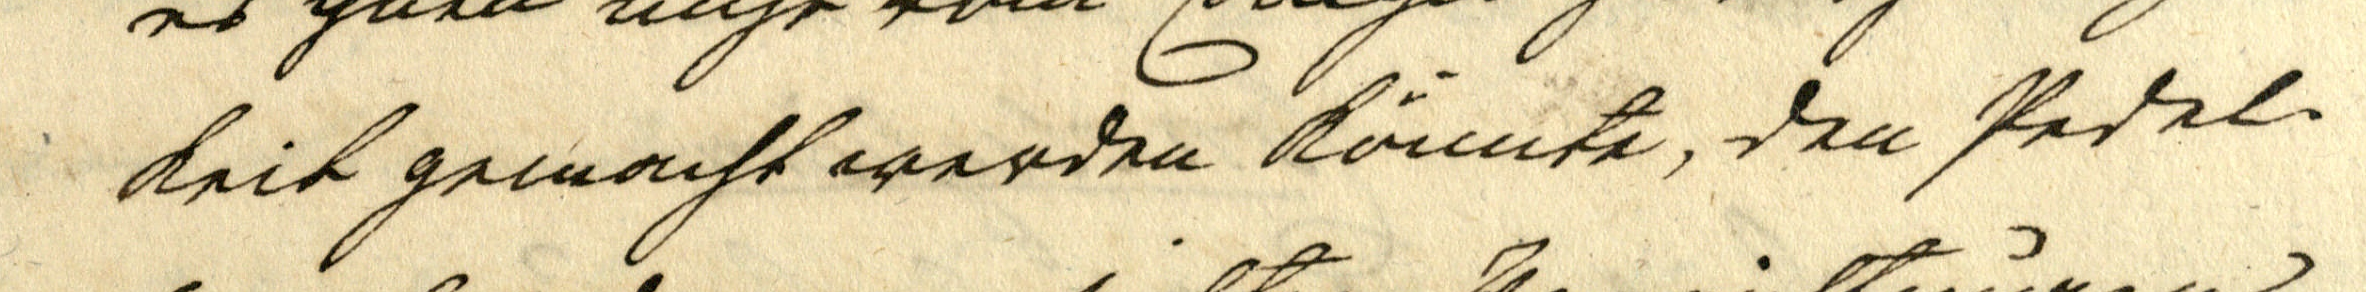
keit gemacht werden könnte, den Pedel¬
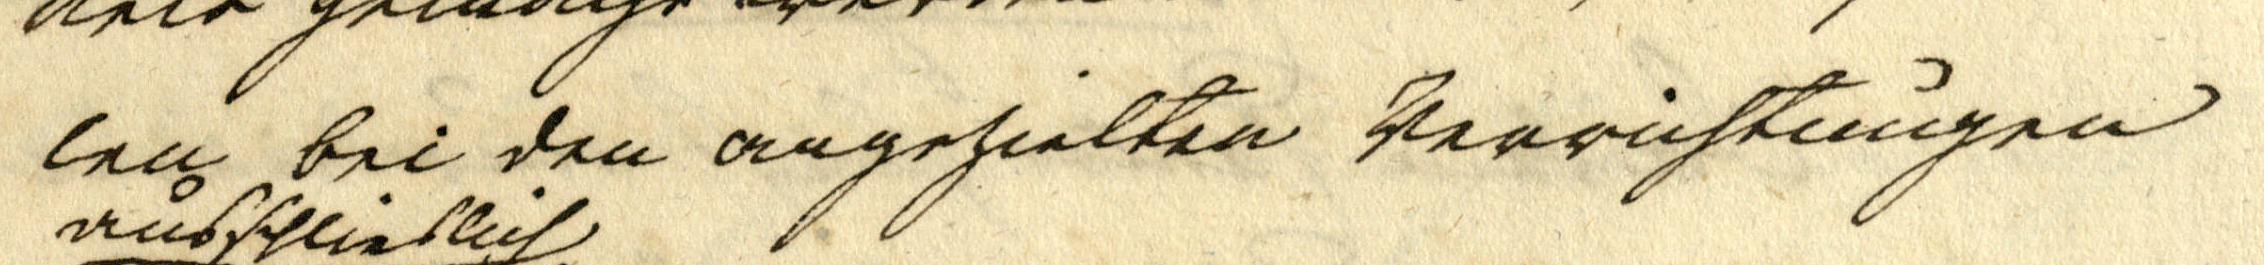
len bei den angezielten Verrichtungen
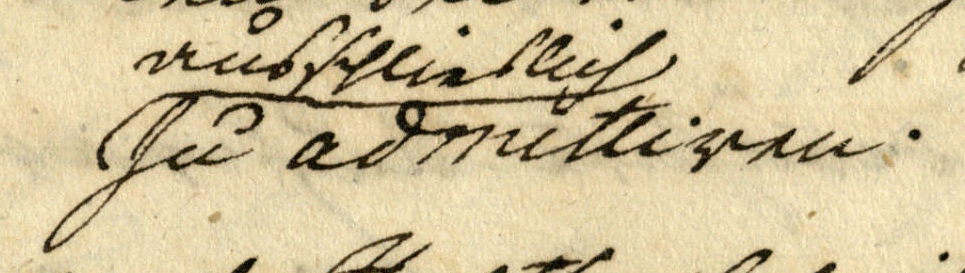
ausschlieslich zu admittiren.
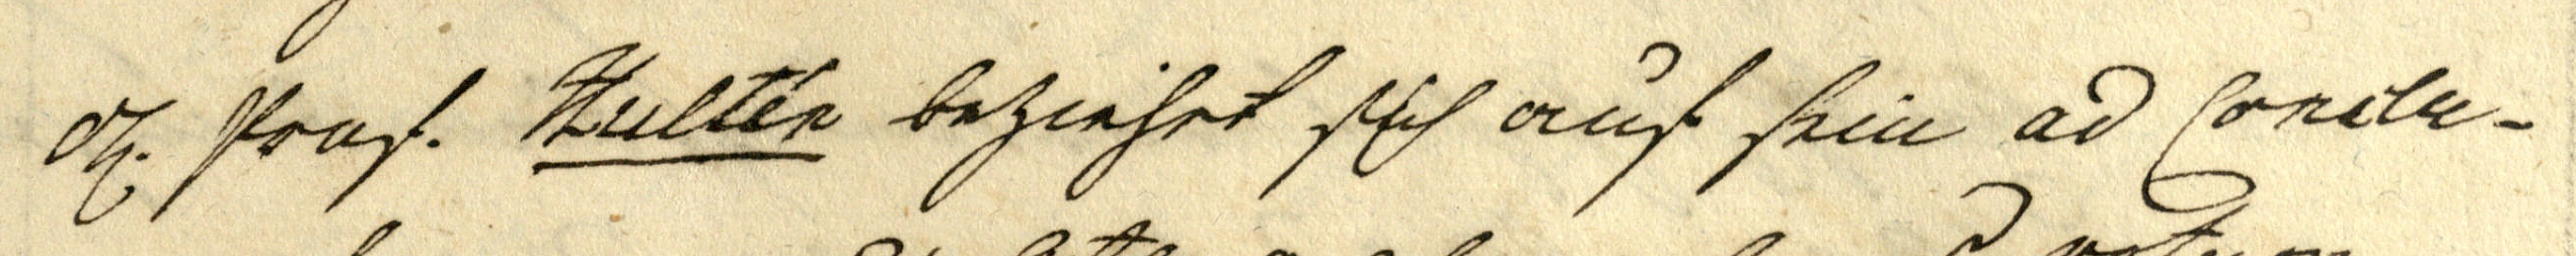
dh. Prof. Hultén beziehet sich auf sein ad Conclu-
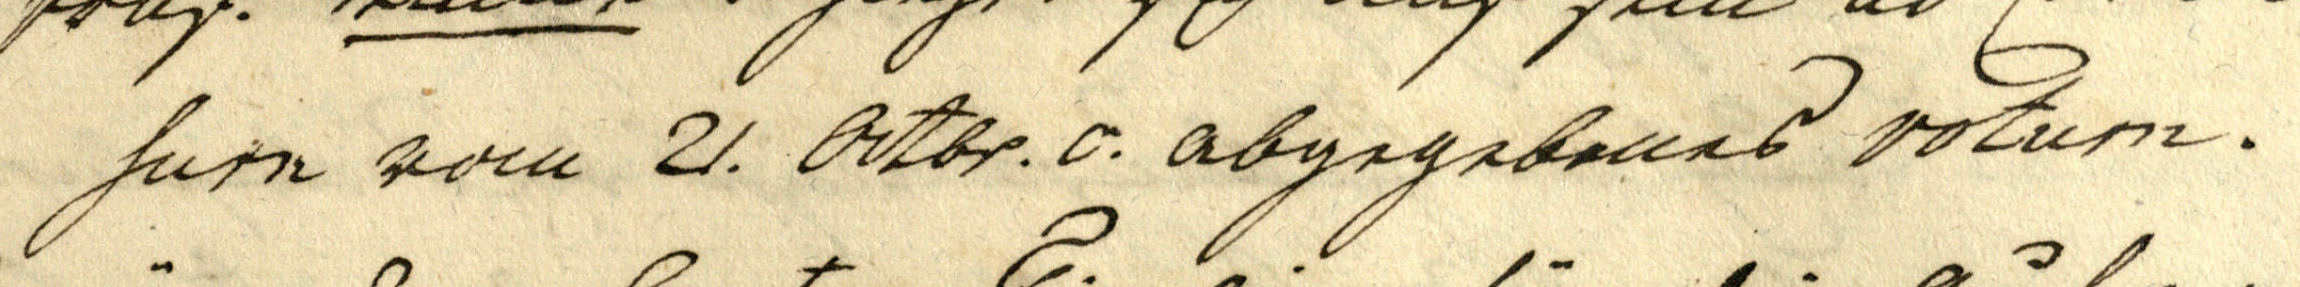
sum vom 21. Octbr. c. abgegebenes votum.
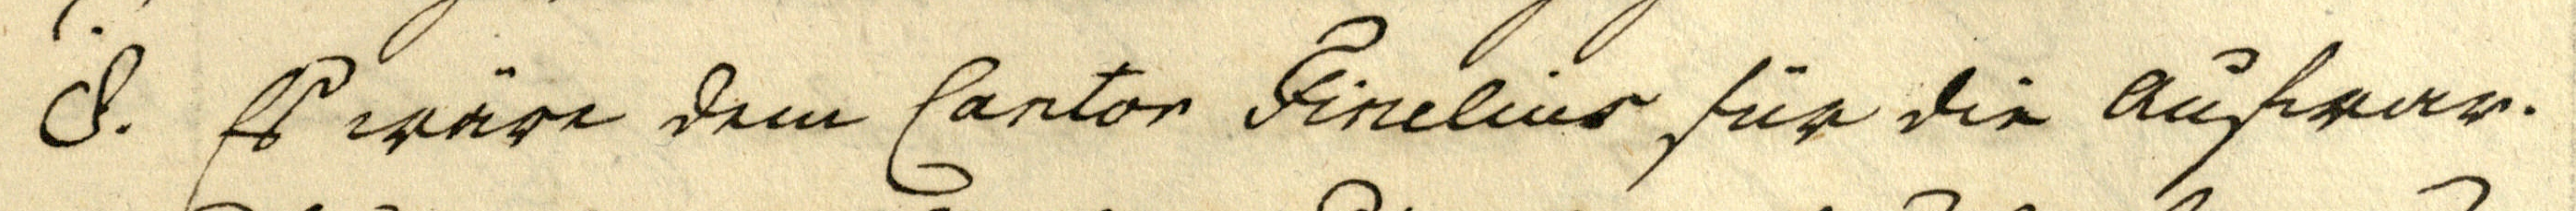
8. Es wäre dem Cantor Finelius für die Aufwar¬
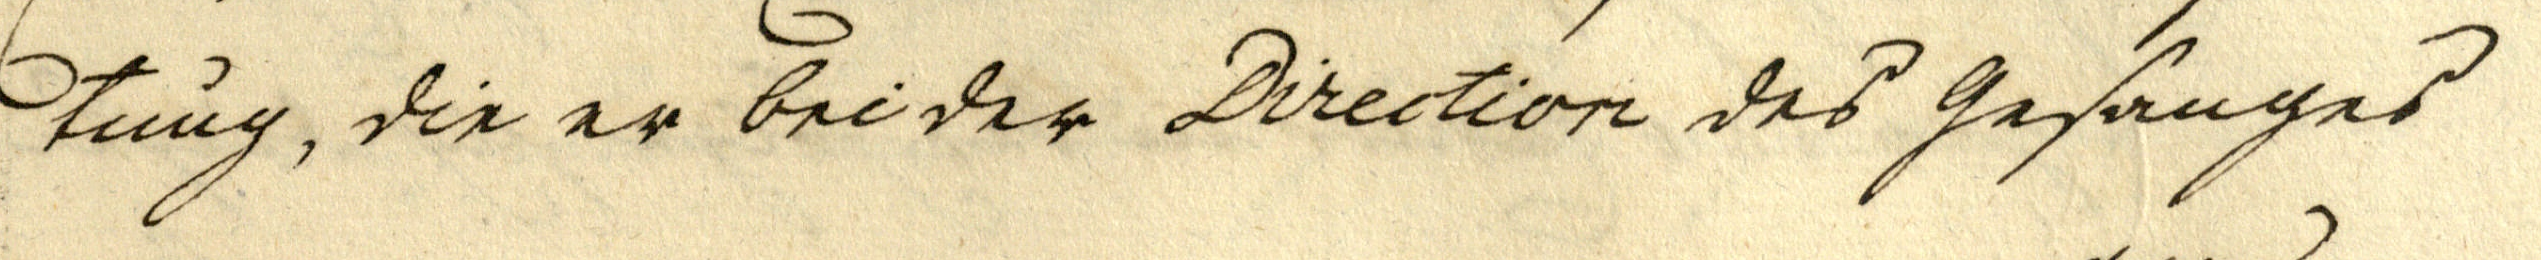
tung, die er bei der Direction des Gesanges
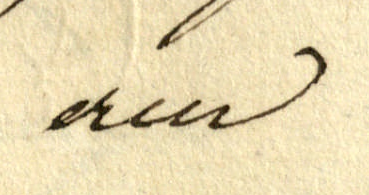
am
